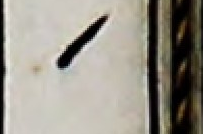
1
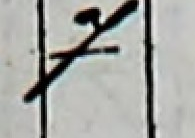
7
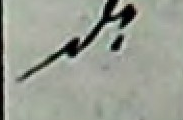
do
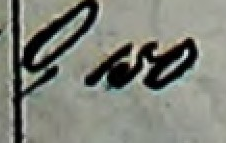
0,150
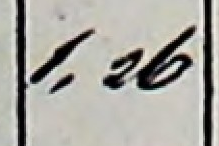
1,26
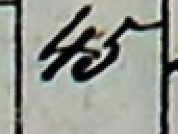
45
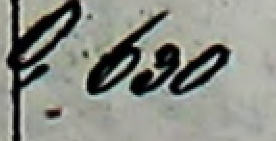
0,630
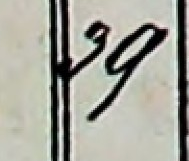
39
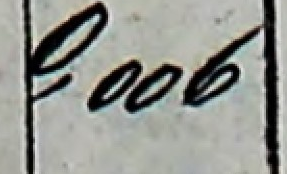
0,006
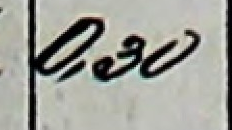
0,30
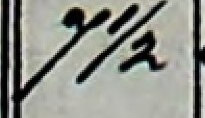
7 ½
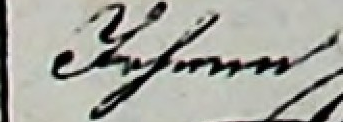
Johann
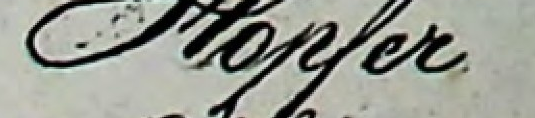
Hopfer
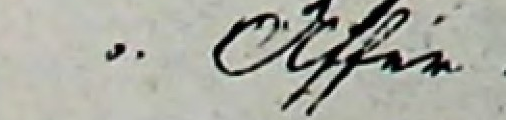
Affer
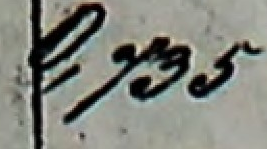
0,735
